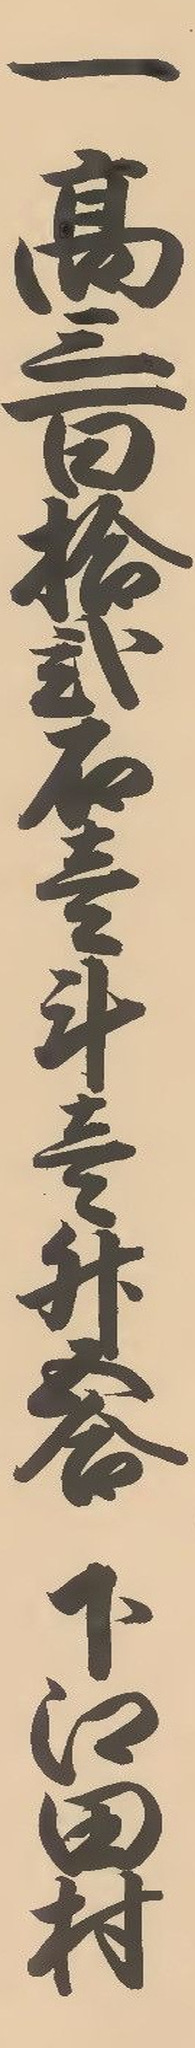一髙三百拾弐石三斗壱升五合下江田村
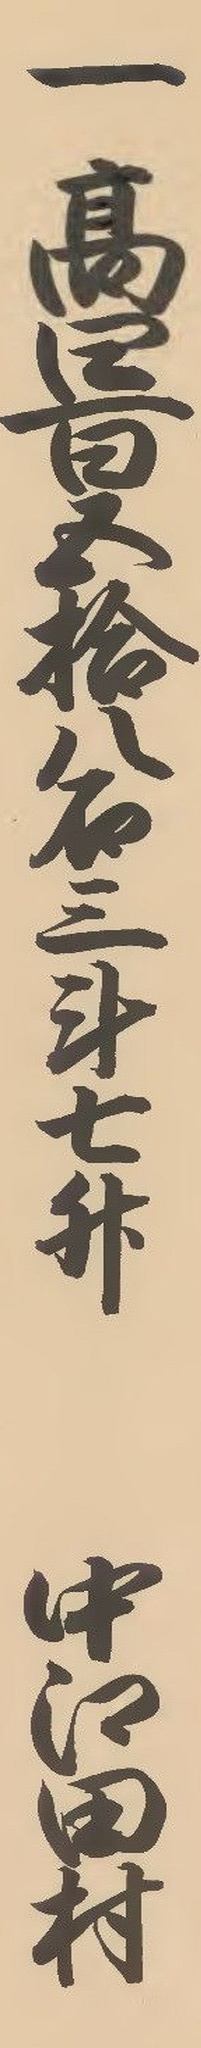一髙四百五拾八石三斗七升中江田村
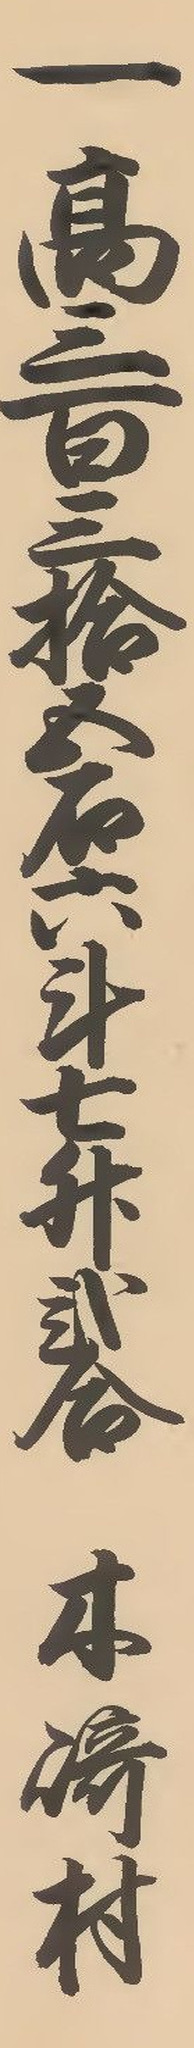一髙三百三拾五石六斗七升弐合木崎村

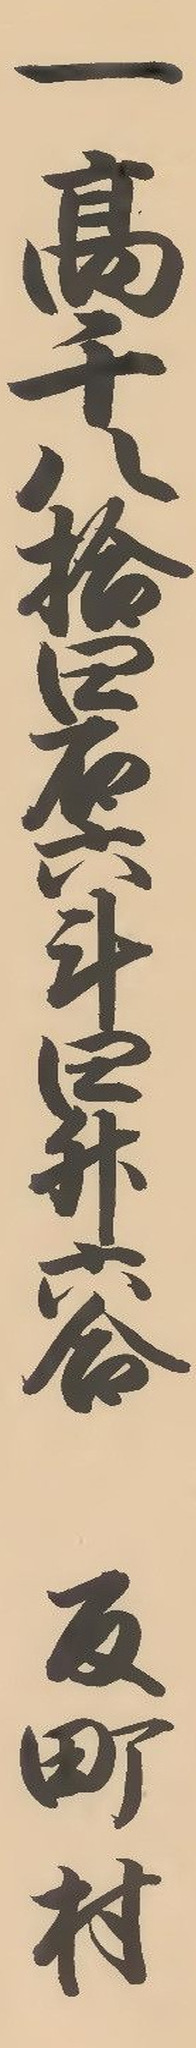一髙千八拾四石六斗四升六合反町村
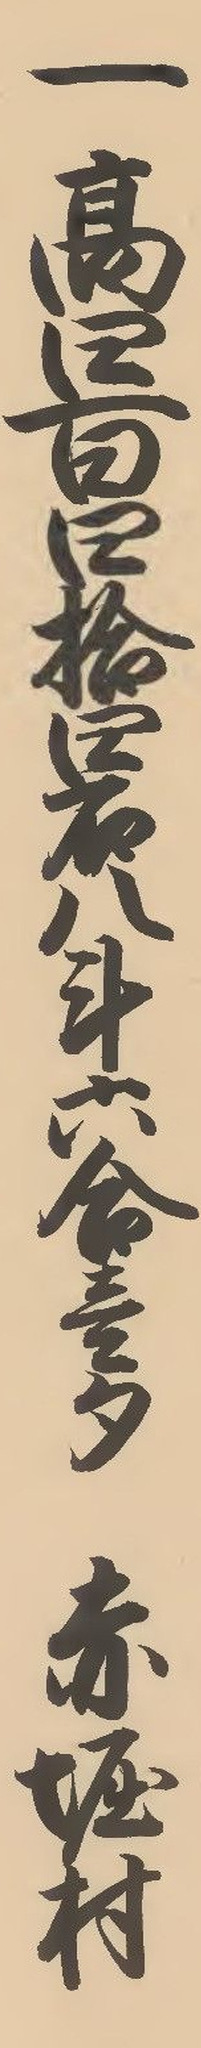一髙四百四拾四石八斗六合壱夕赤堀村
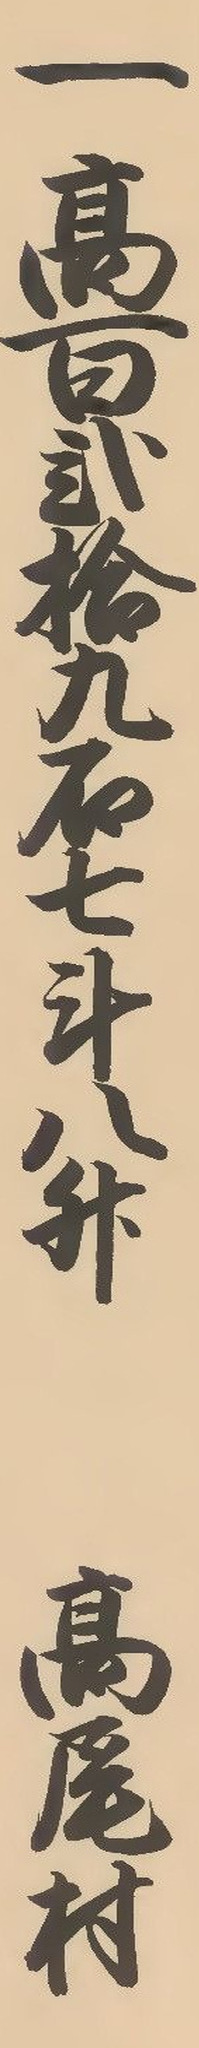一髙百弐拾九石七斗八升高尾村
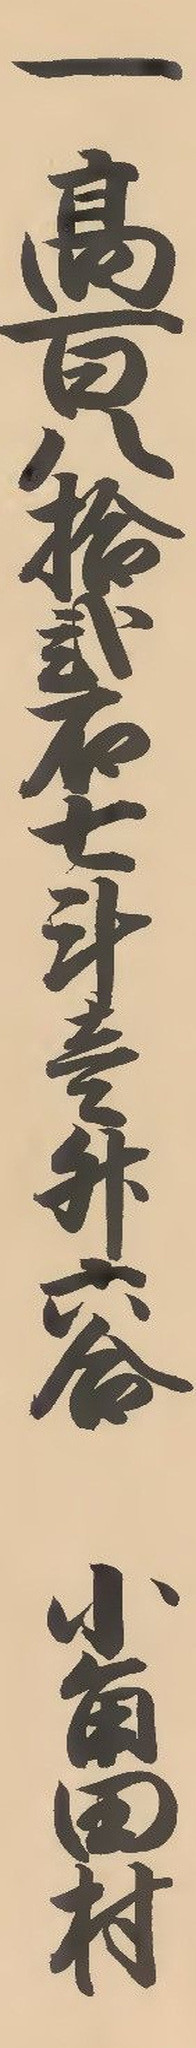一髙百八拾弐石七斗壱升六合小角田村
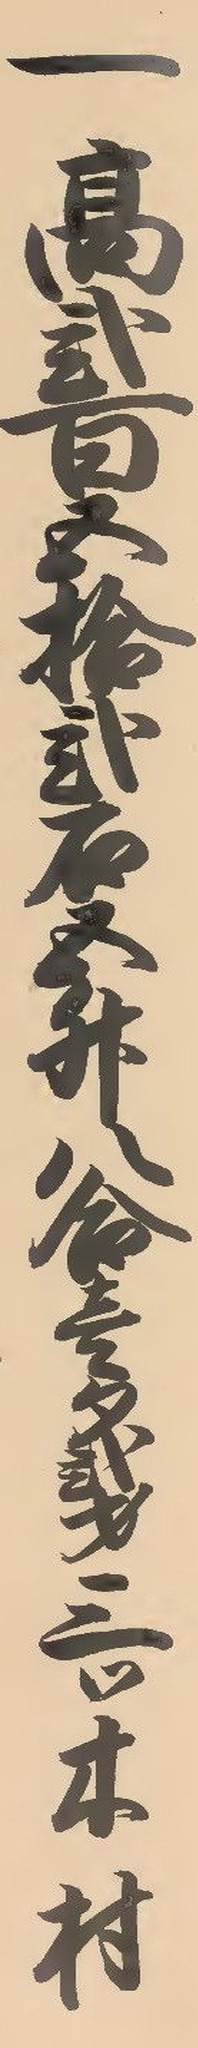一髙弐百五拾弐石五升八合壱夕弐才三ツ木村
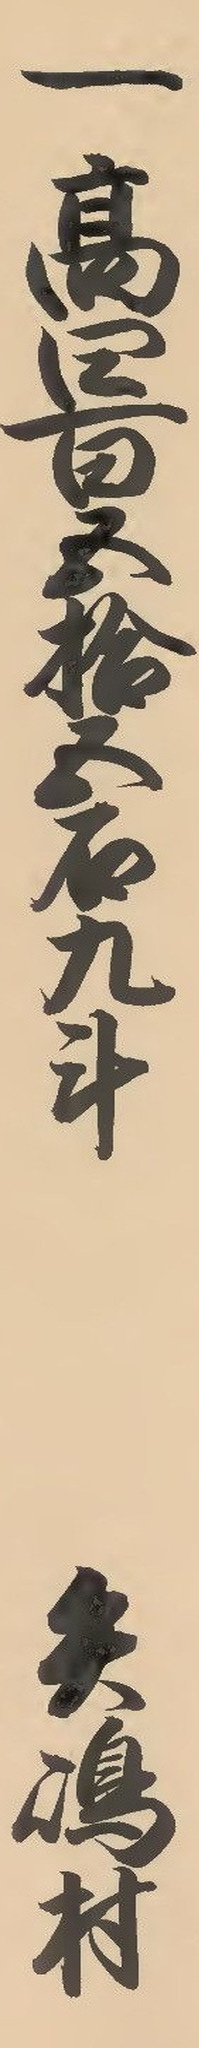一髙四百五拾五石九斗矢嶋村
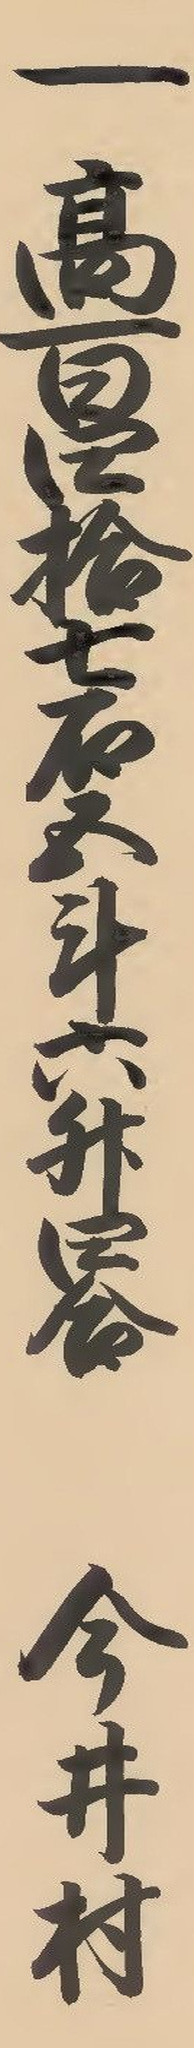一髙百四拾七石五斗六升四合今井村
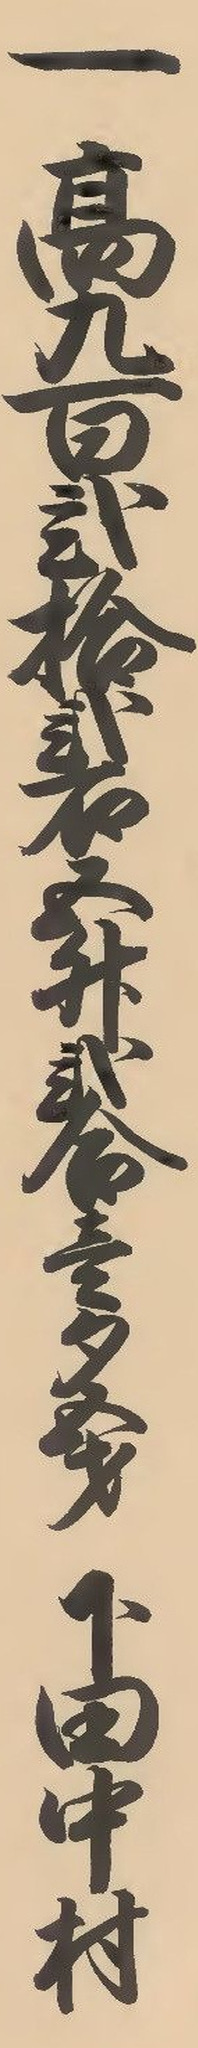一髙九百弐拾弐石五升弐合壱夕五才下田中村

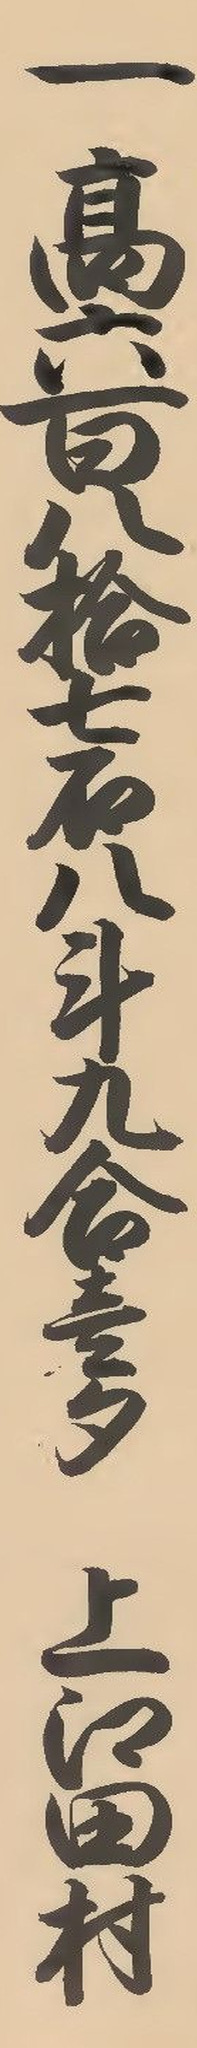一髙六百八拾七石八斗九合壱夕上沼田村
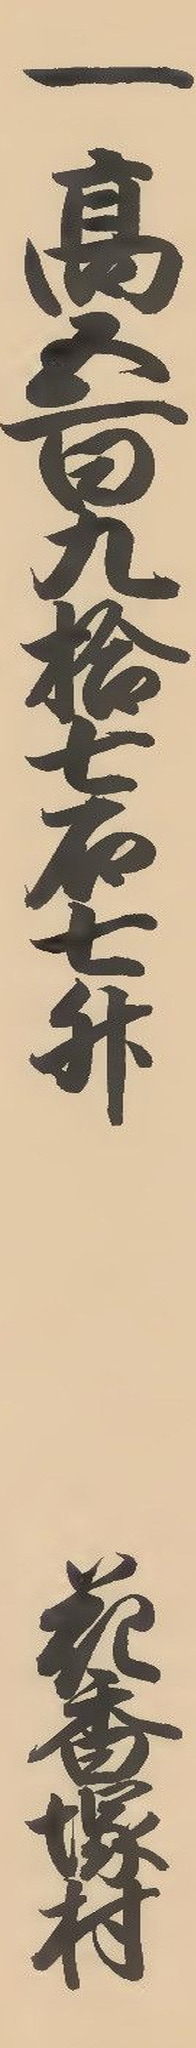一髙五百九拾七石七升花香塚村
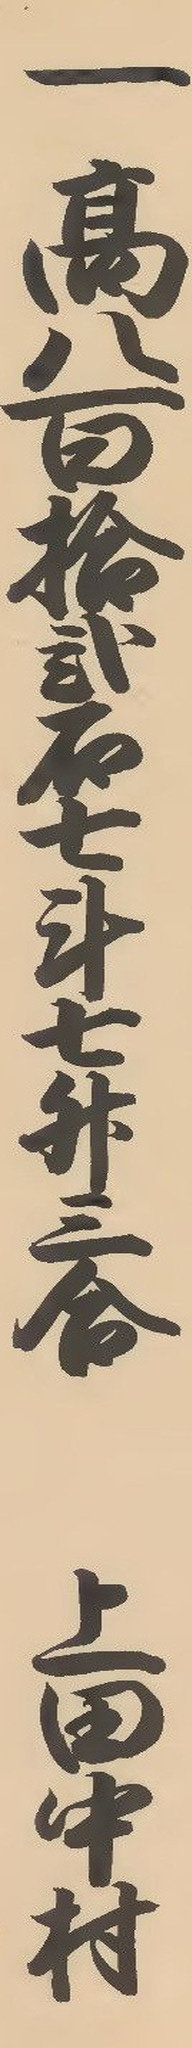一髙八百拾弐石七斗七升三合上田中村
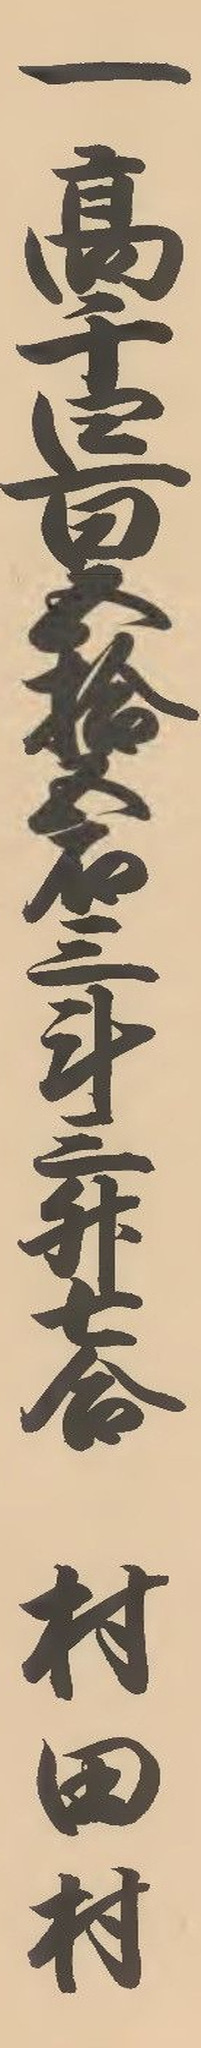一髙千四百五拾五石三斗三升七合村田村
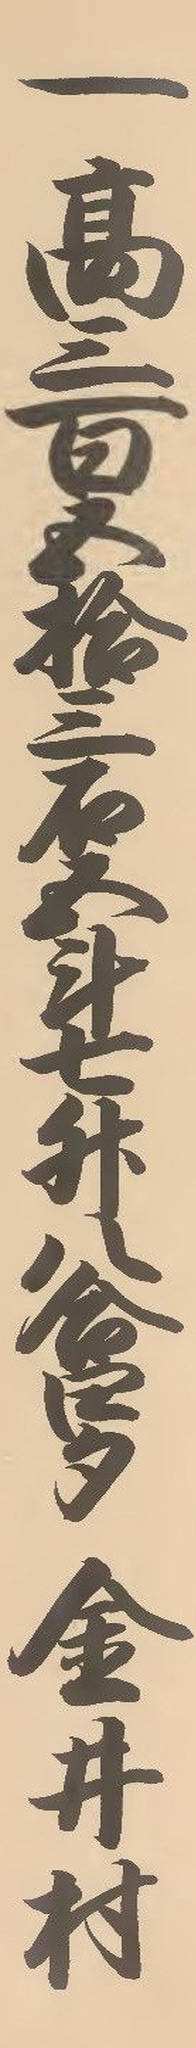一髙三百五拾三石五斗七升八合四夕金井村
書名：上野国郷帳
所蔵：国立公文書館 National Archives of Japan
